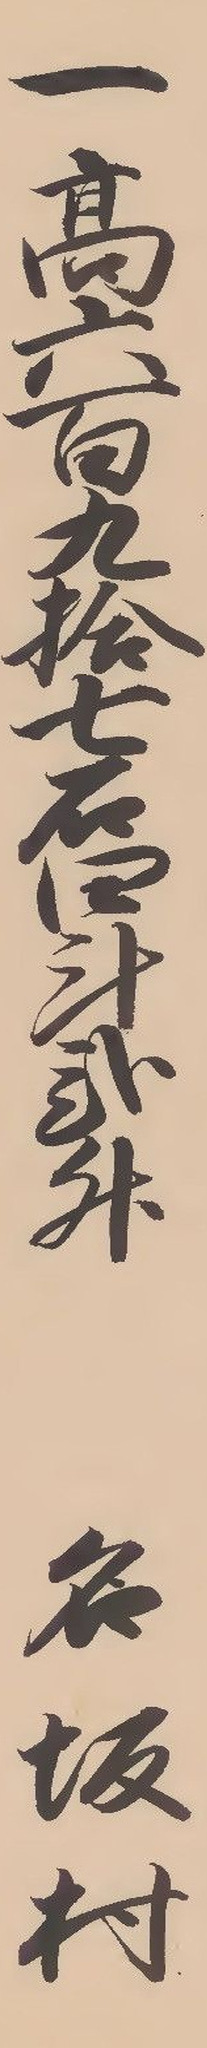一高六百九拾七石四斗弐升名坂村
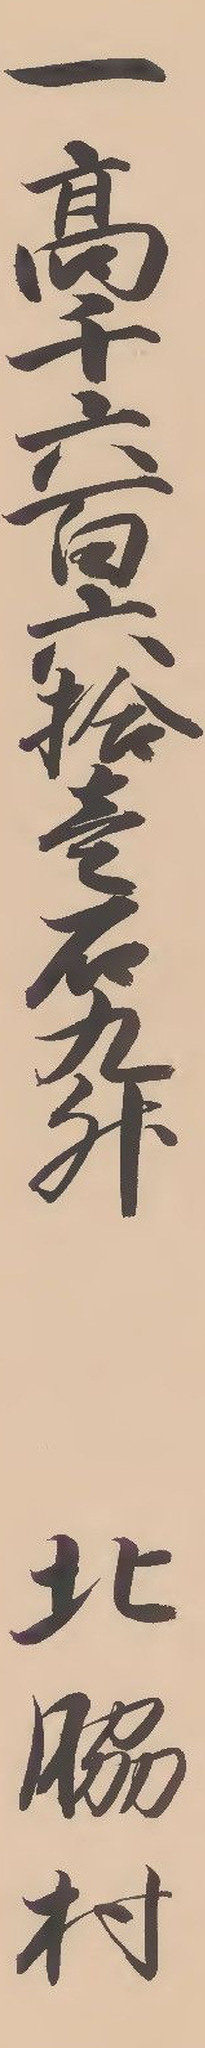一高千六百六拾壱石九升北脇村

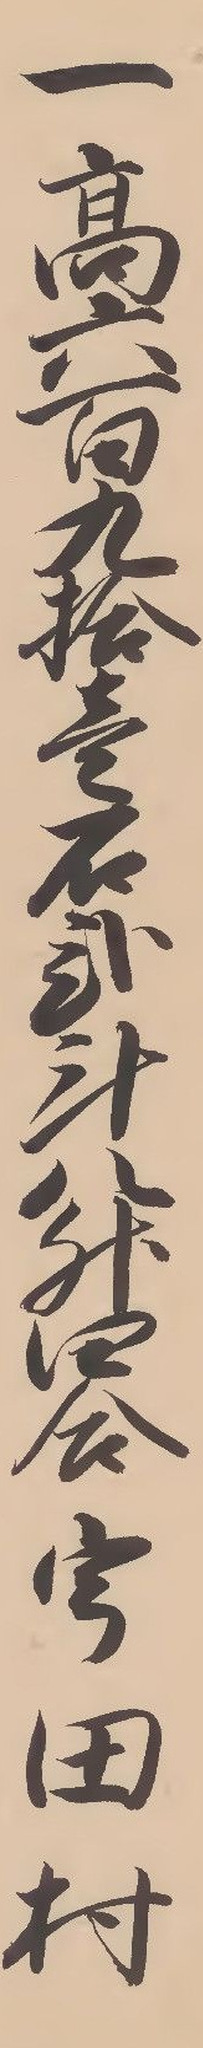一高六百九拾壱石弐斗八升四合宇田村
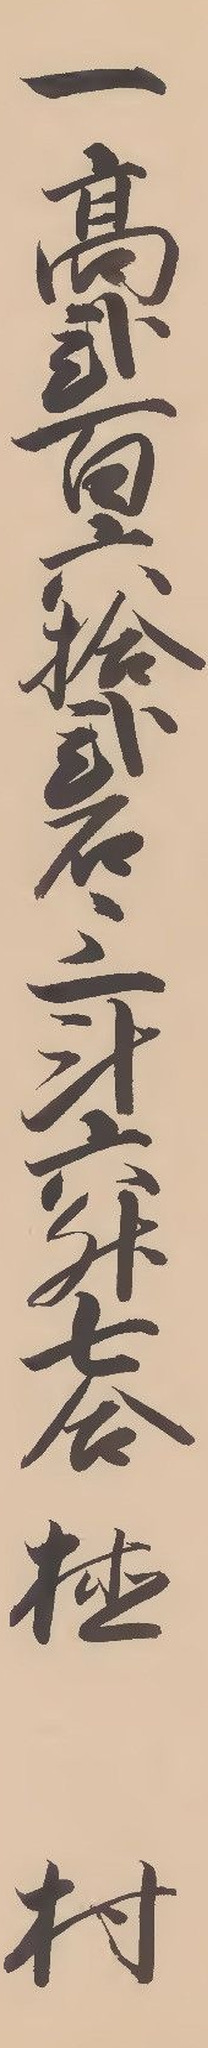一高弐百六拾弐石三斗六升七合植村
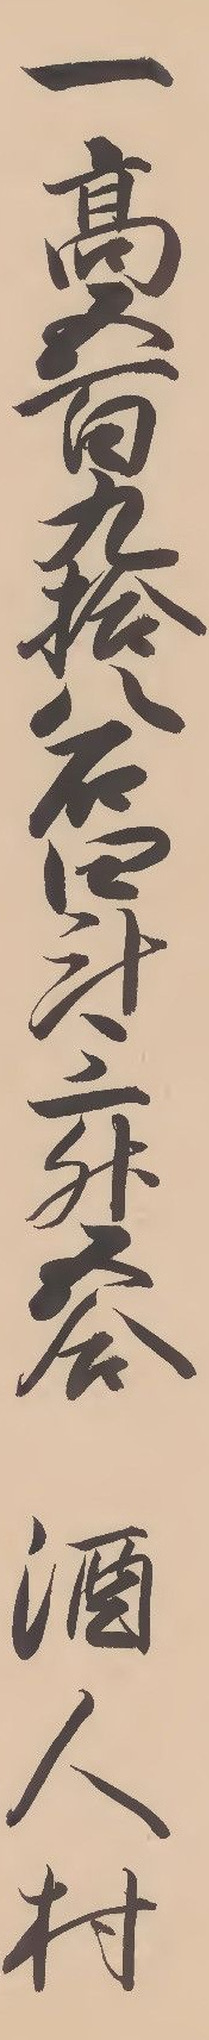一高五百九拾八石四斗三升五合酒人村
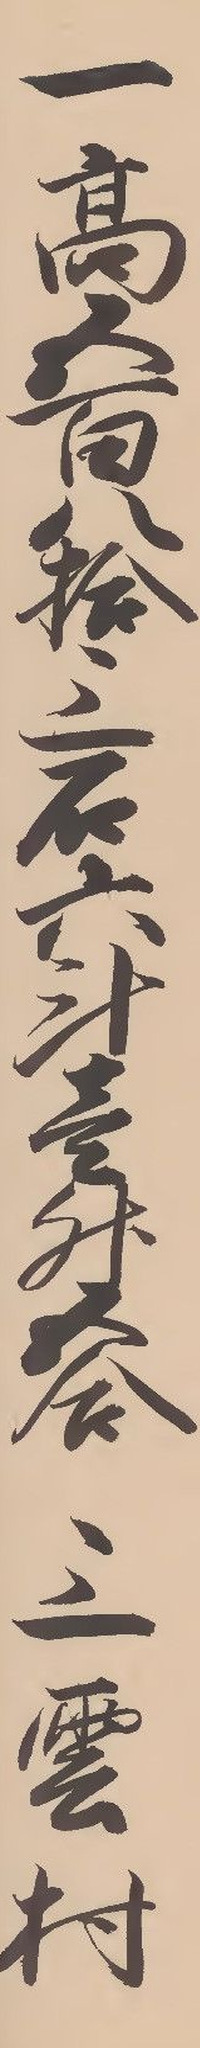一高五百八拾三石六斗壱升五合三雲村
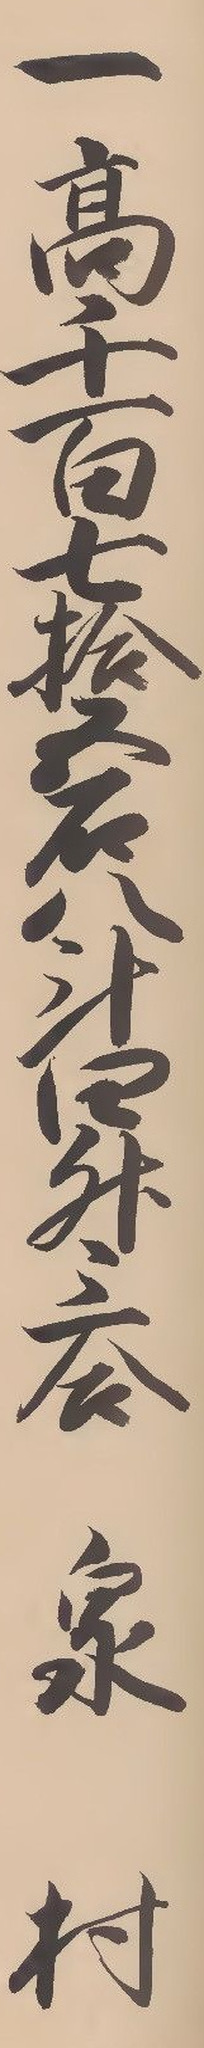一高千百七拾五石八斗四升三合泉村
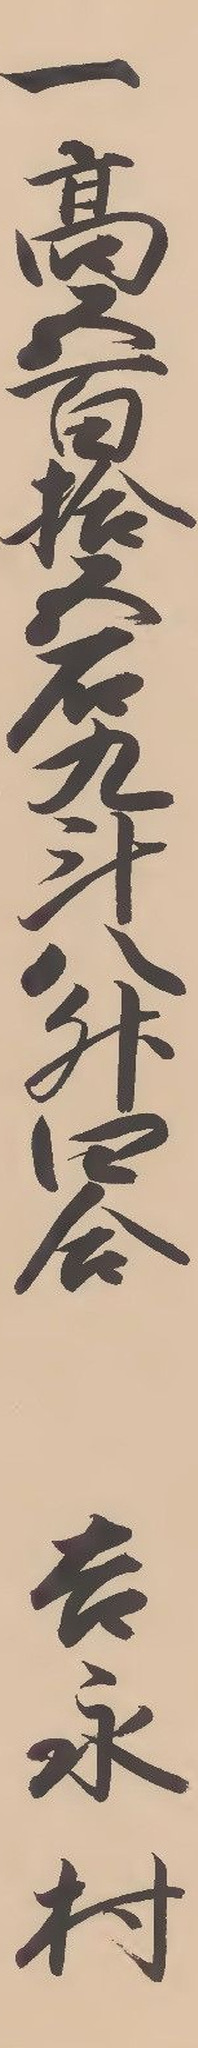一高五百拾五石九斗八升四合吉永村
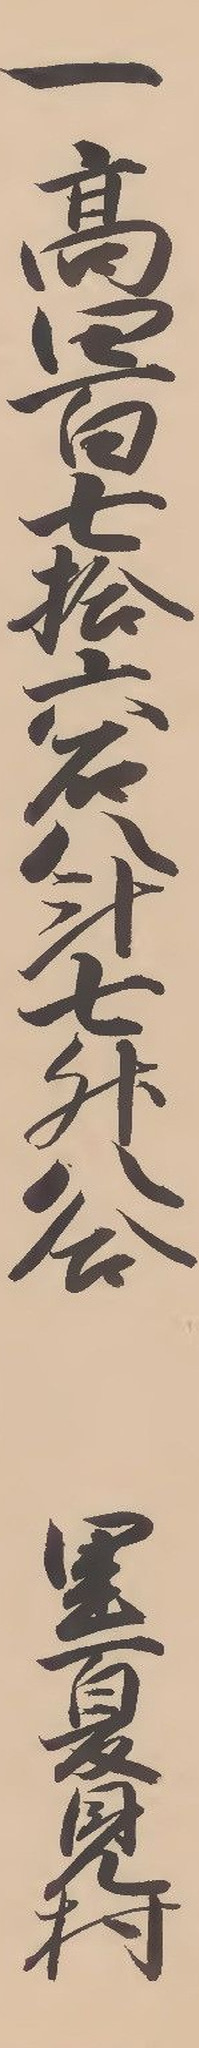一高四百七拾六石八斗七升八合里夏見村
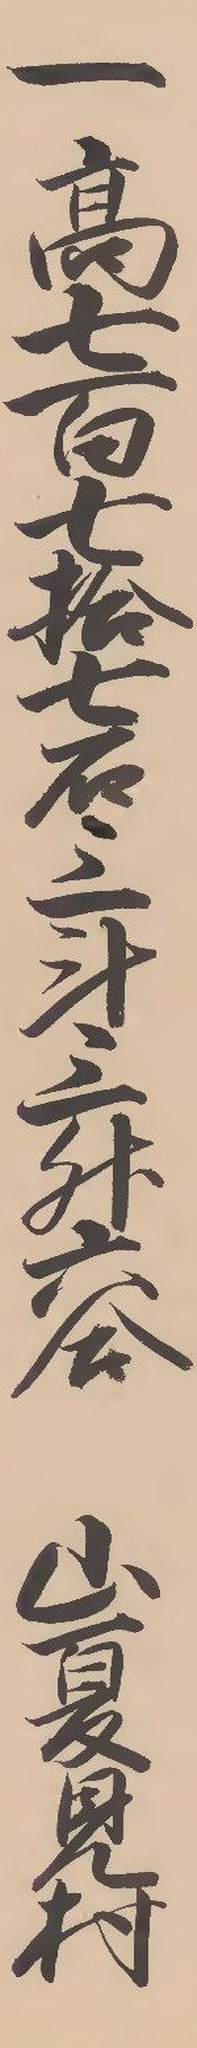一高七百七拾七石三斗三升六合山夏見村

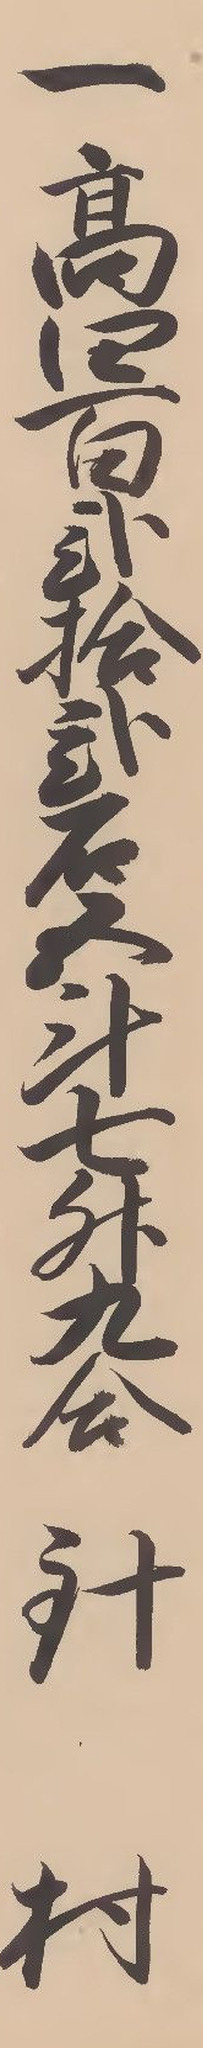一高四百弐拾弐石五斗七升九合針村
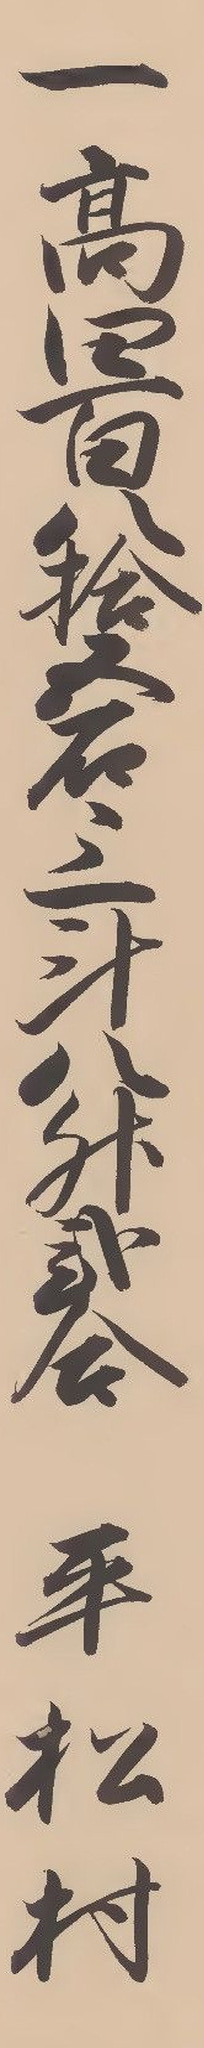一高四百八拾五石三斗八升弐合平松村
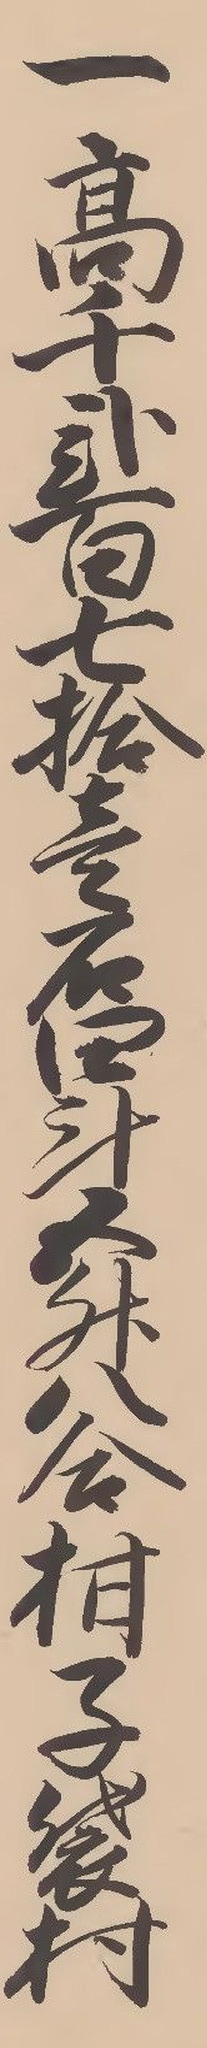一高千弐百七拾壱石四斗五升八合柑子袋村
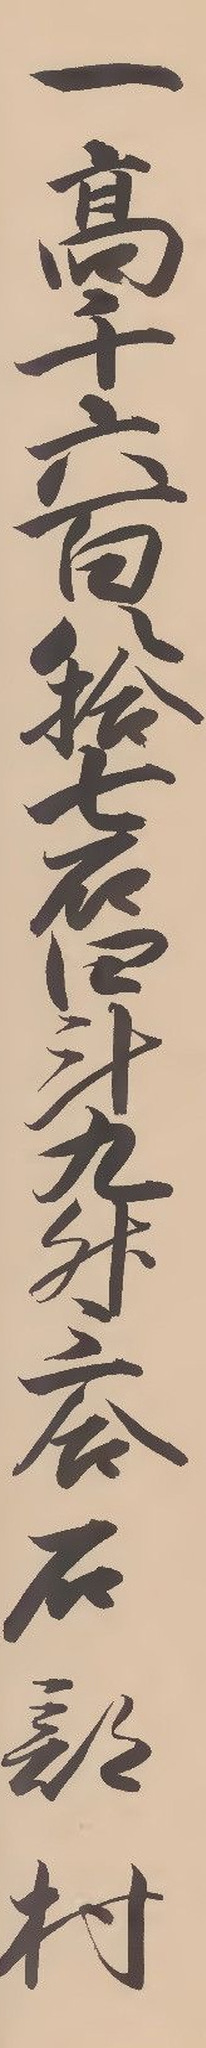一高千六百八拾七石四斗九升三合石部村
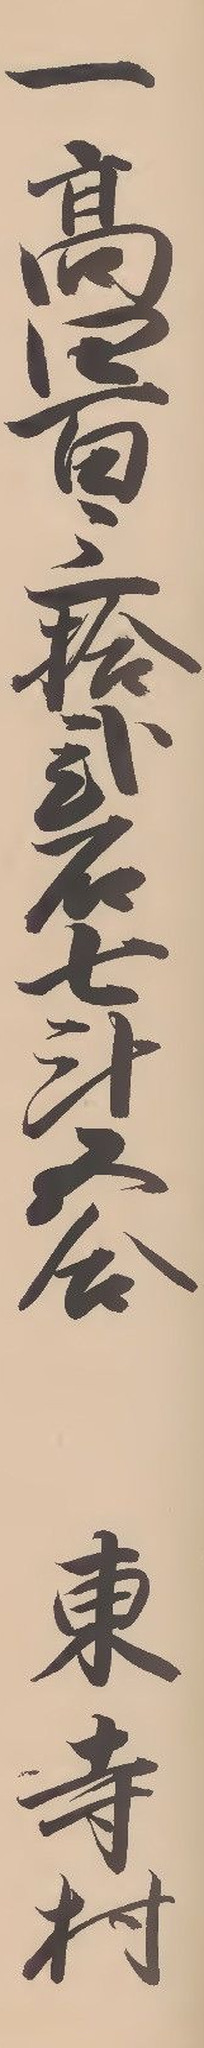一高四百三拾弐石七斗五合東寺村
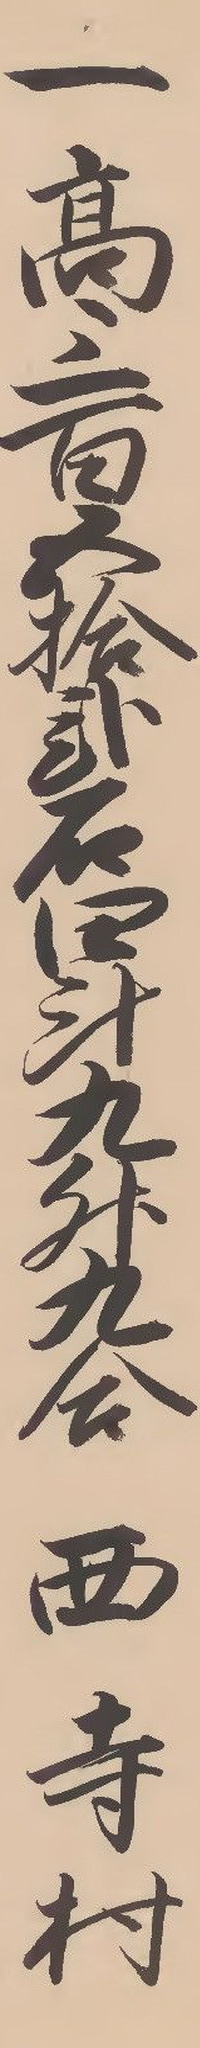一高三百五拾弐石四斗九升九合西寺村
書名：近江国郷帳
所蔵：国立公文書館 National Archives of Japan
